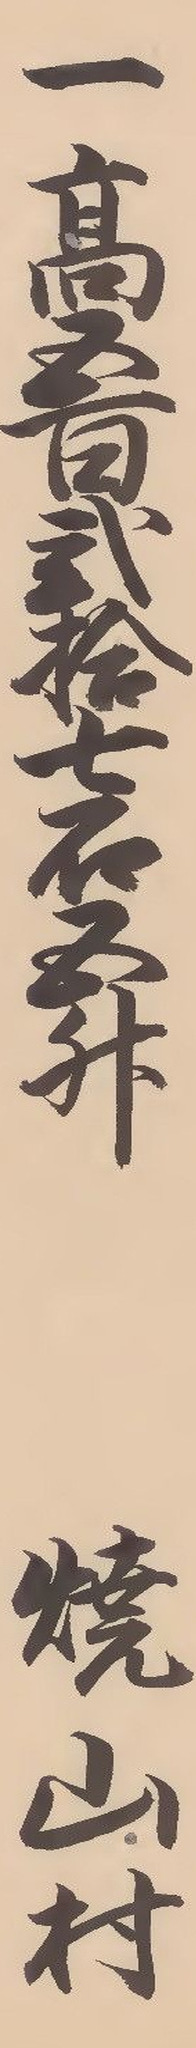一高五百弐拾七石五升焼山村
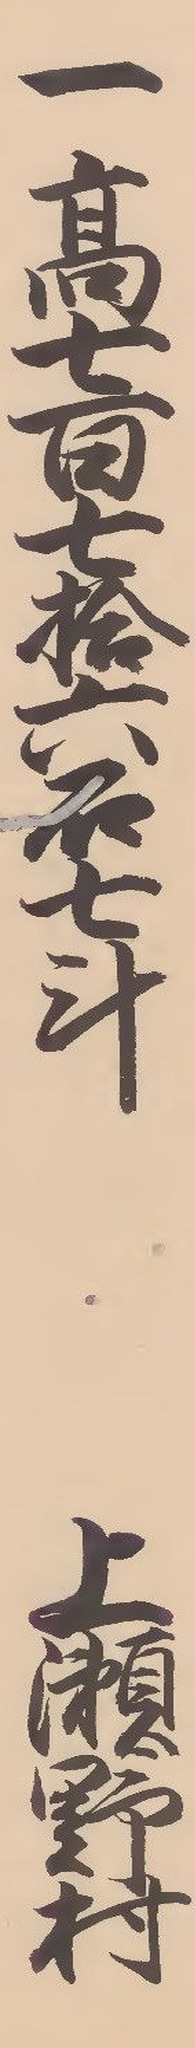一高七百七拾六石七斗上瀬野村

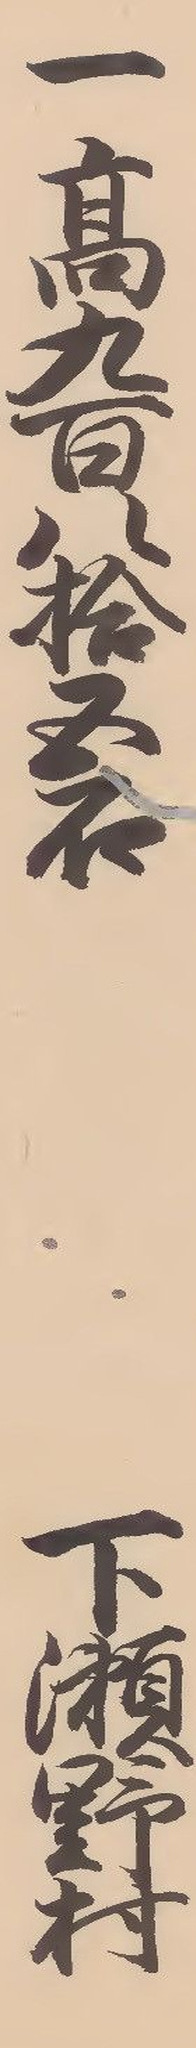一高九百八拾五石下瀬野村
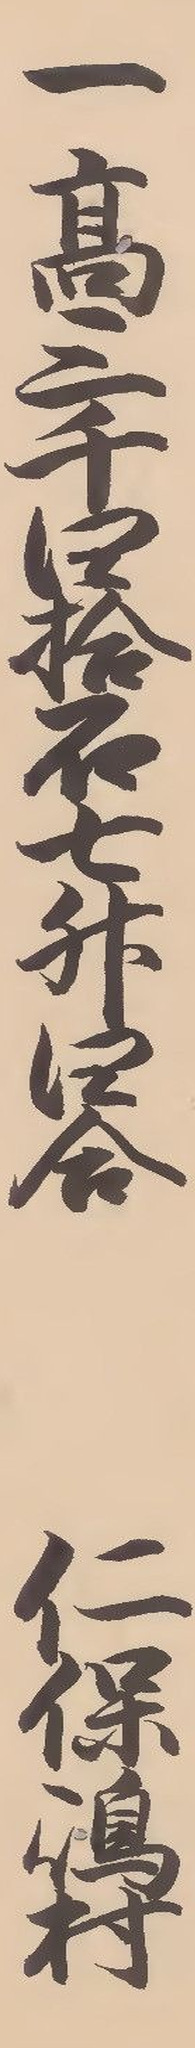一高三千四拾石七升四合仁保島村
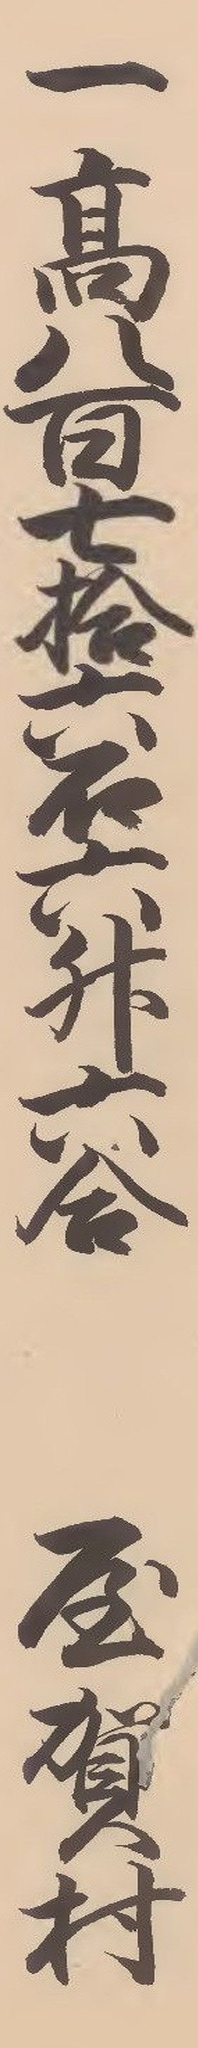一高八百七拾六石六升六合屋賀村
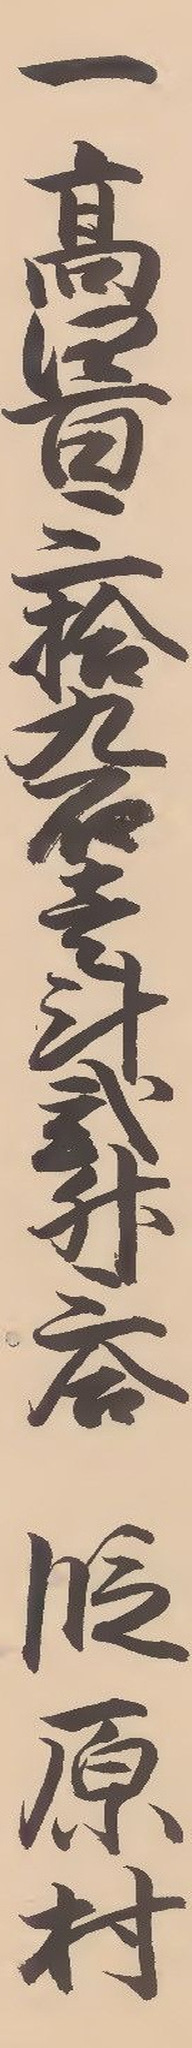一高四百三拾九石壱斗弐升三合段原村
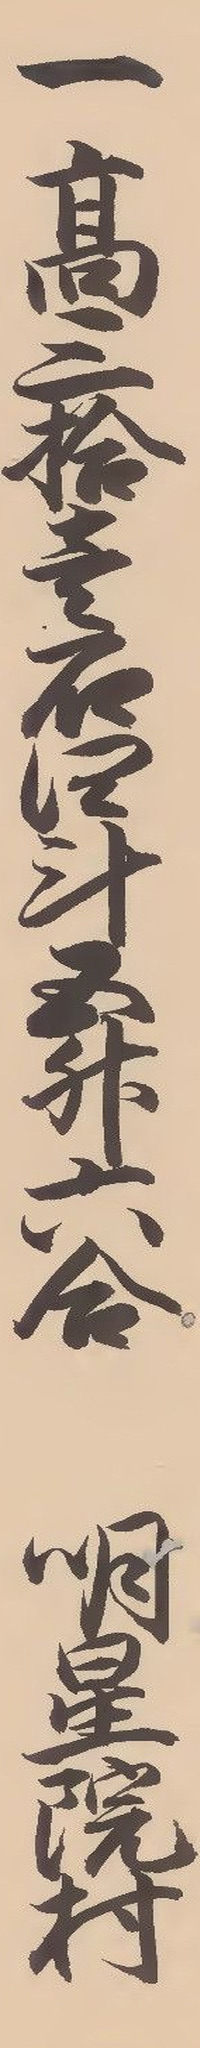一高三拾壱石四斗五升六合明星院村
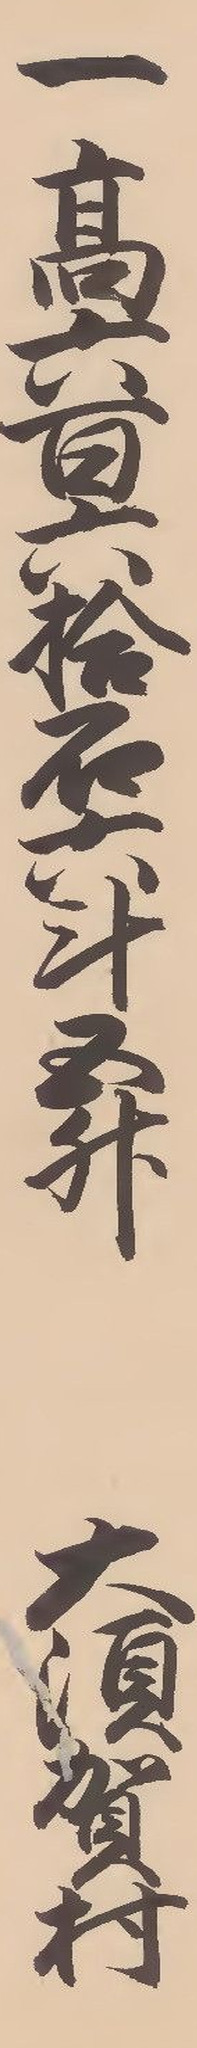一高六百六拾石六斗五升大須賀村
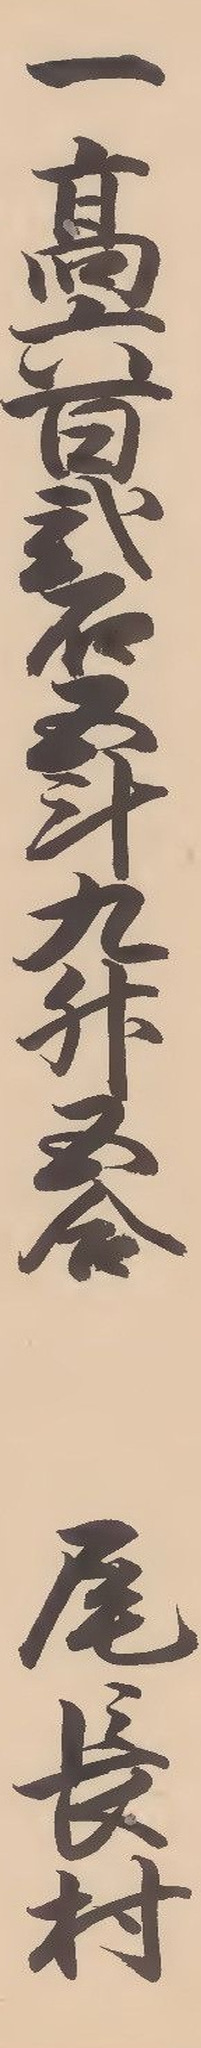一高六百弐石五斗九升五合尾長村
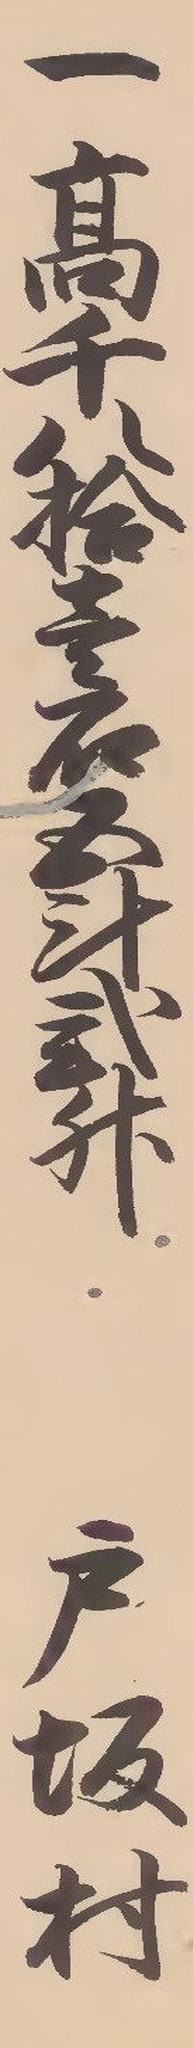一高千八拾壱石五斗弐升戸坂村

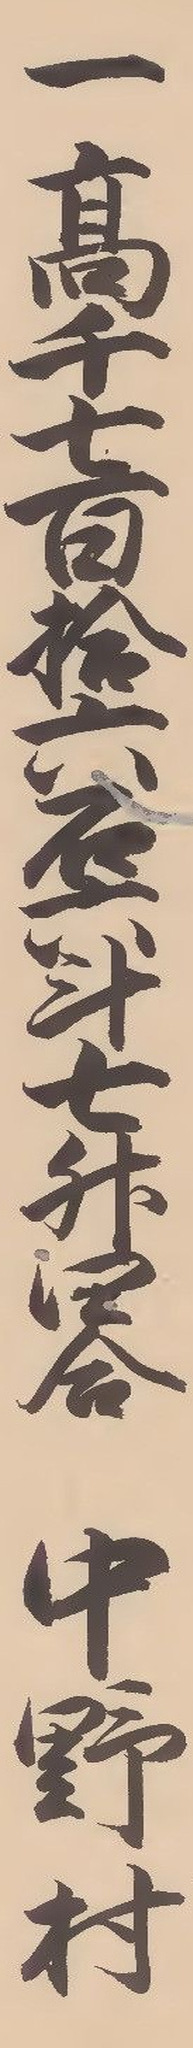一高千七百拾六石六斗七升四合中野村
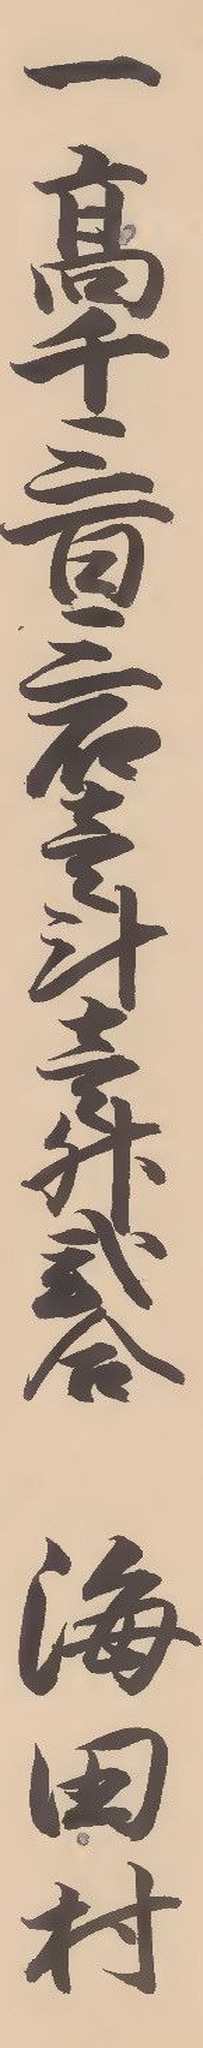一高千三百三石壱斗壱升弐合海田村
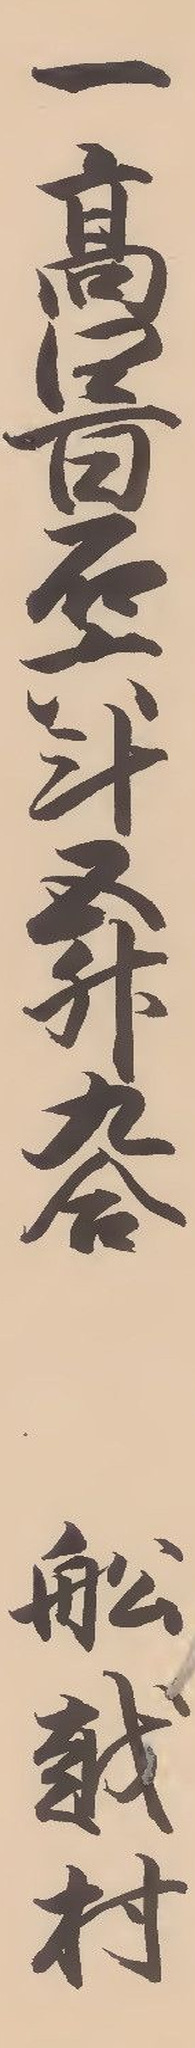一高四百石六斗五升九合船越村
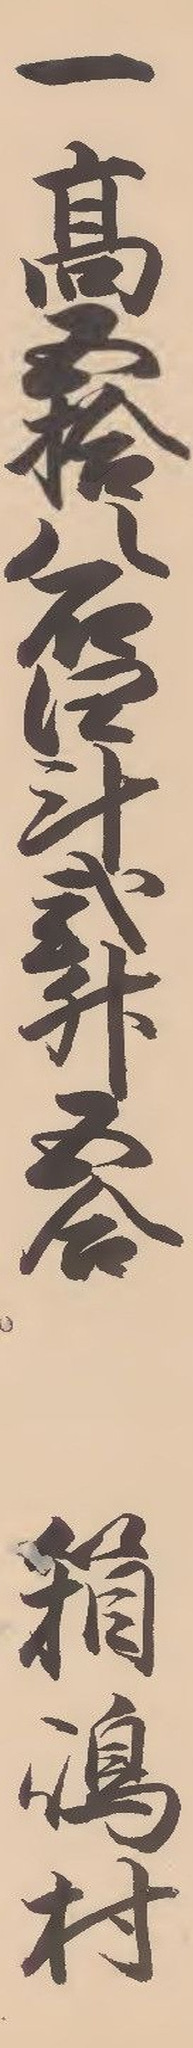一高五拾八石四斗弐升五合箱島村
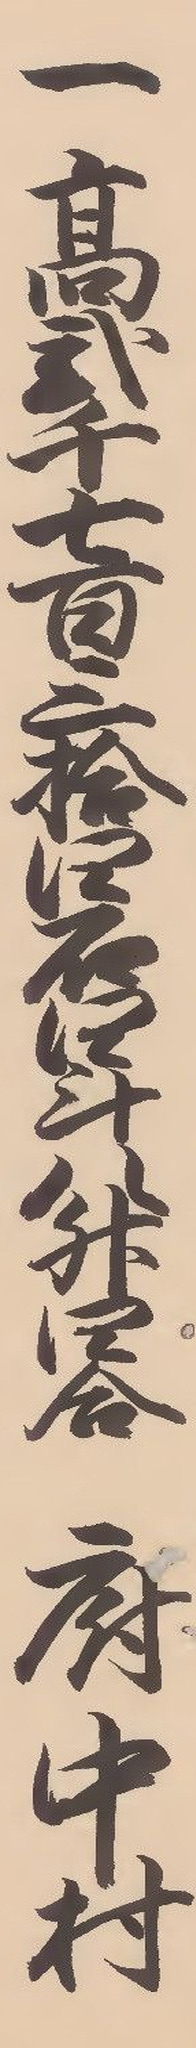一高弐千七百三拾四石四斗八升四合府中村
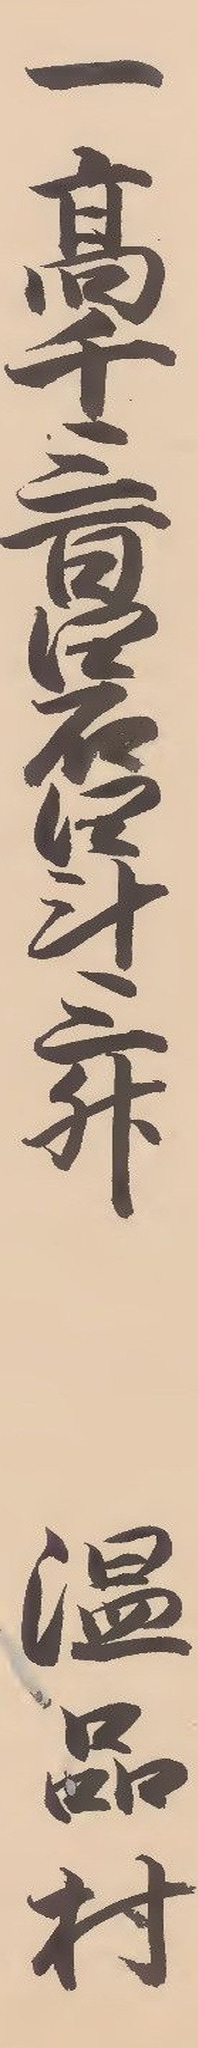一高千三百四石四斗三升温品村
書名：安芸国郷帳
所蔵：国立公文書館 National Archives of Japan
